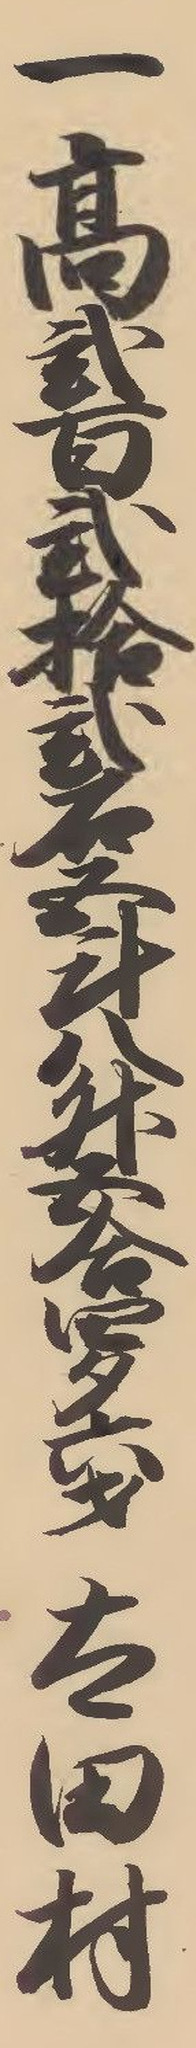一高弐百弐拾弐石五斗八升五合四勺六才太田村

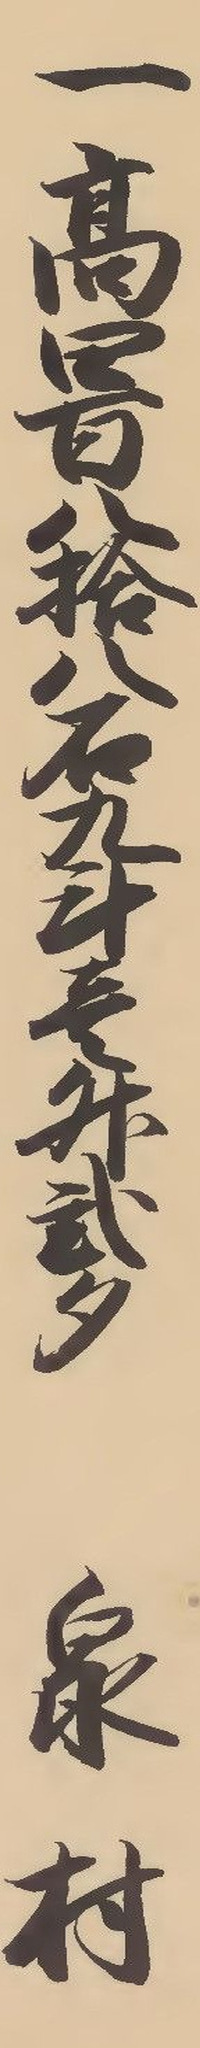一高四百八拾八石九斗壱升弐勺泉村
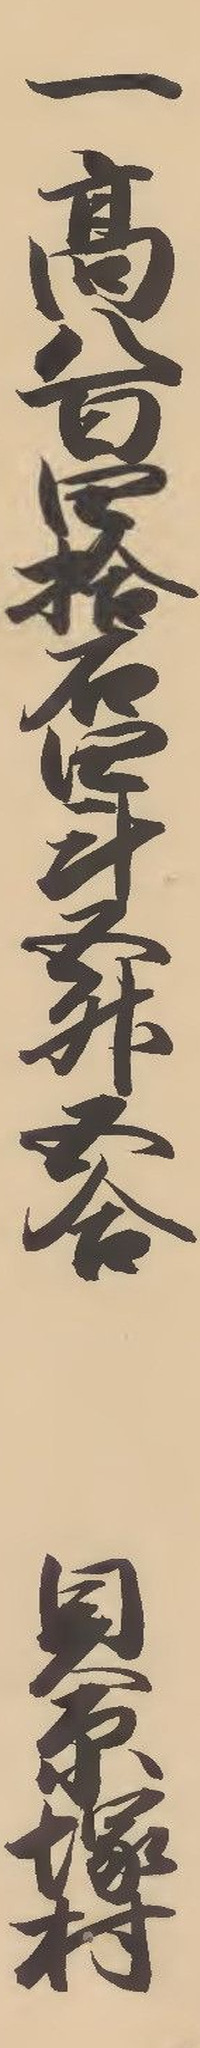一高八百四拾石四斗五升五合貝原塚村
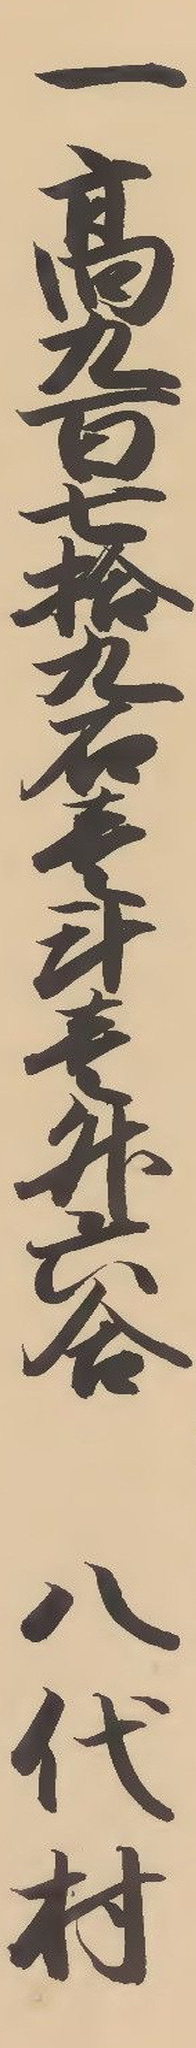一高九百七拾九石壱斗壱升六合八代村
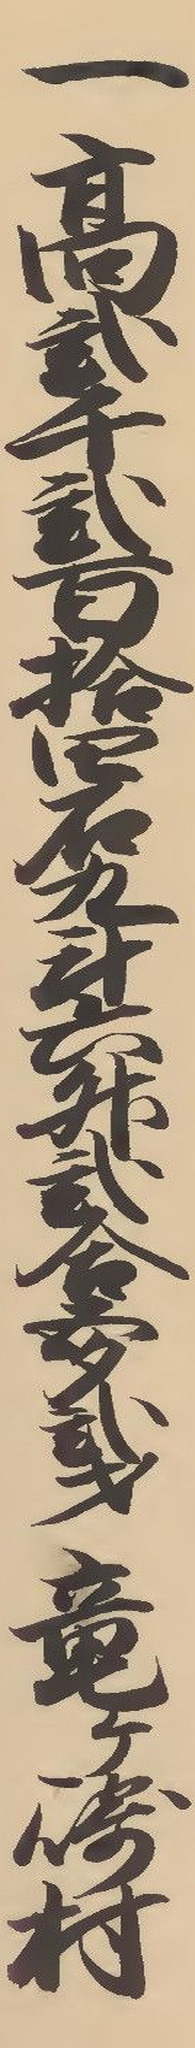一高弐千弐百拾四石九斗六升弐合五勺弐才竜ヶ崎村
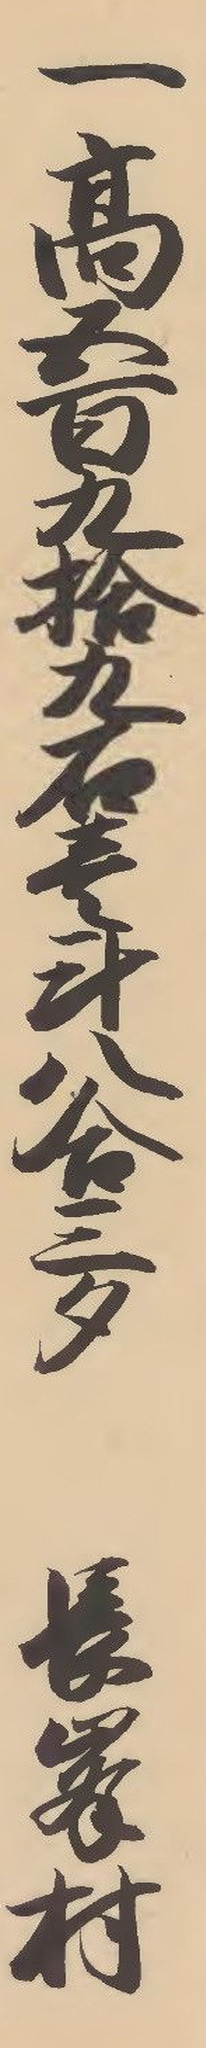一高五百九拾九石壱斗八合三勺長峯村
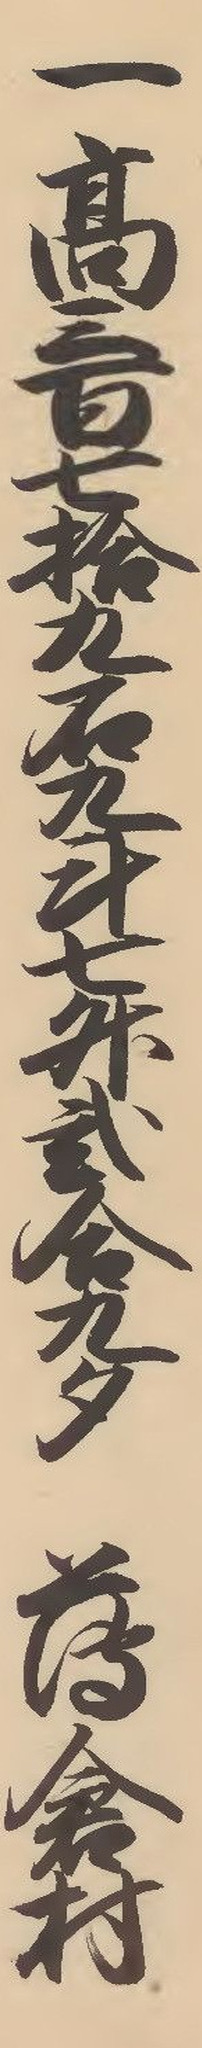一高三百七拾九石九斗七升弐合九勺薄倉村
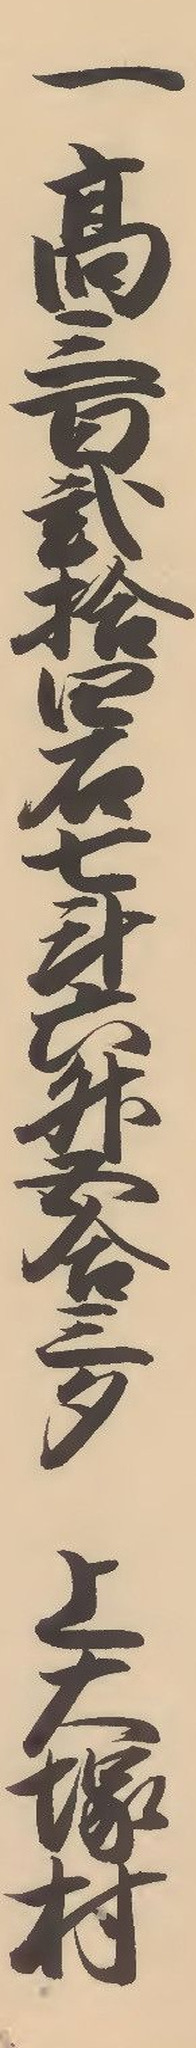一高三百弐拾四石七斗六升五合三勺上大塚村
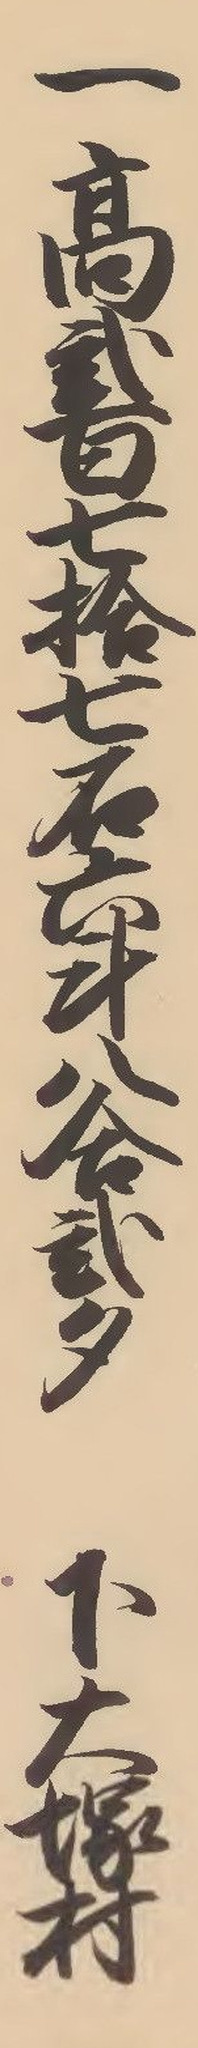一高弐百七拾七石六斗八合弐勺下大塚村

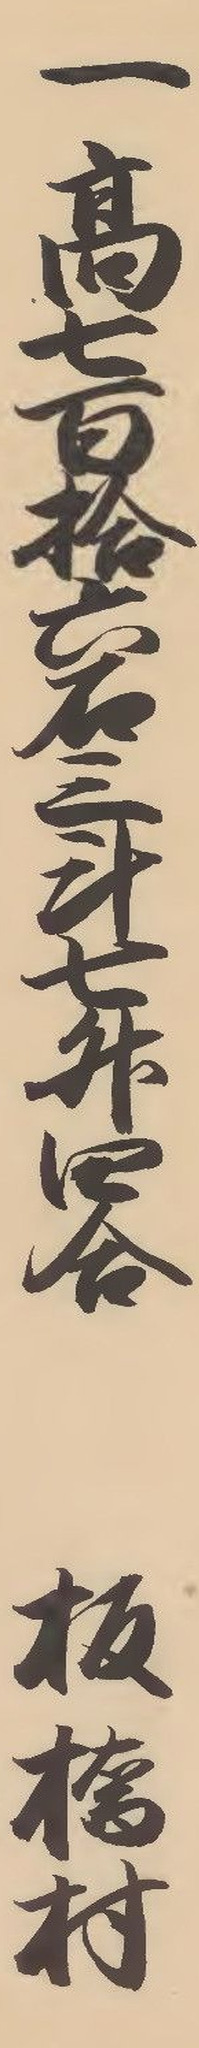一高七百拾六石三斗七升四合板橋村
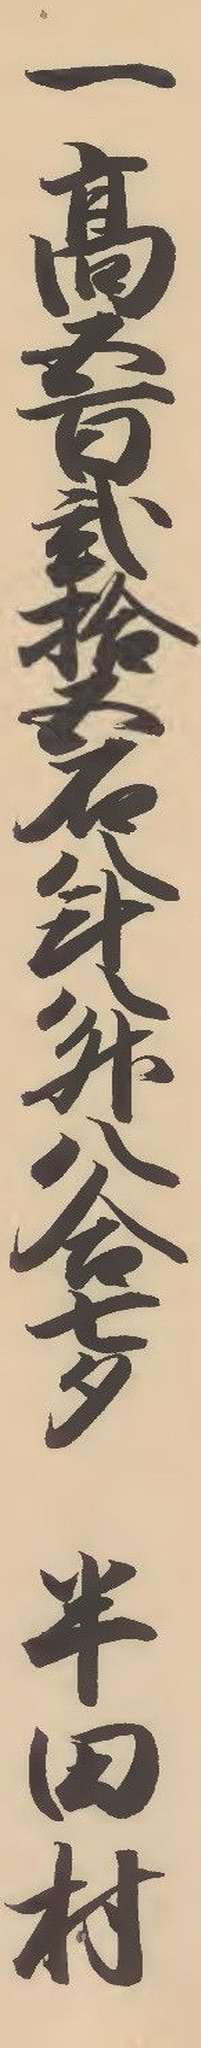一高五百弐拾五石八斗八升八合七勺半田村
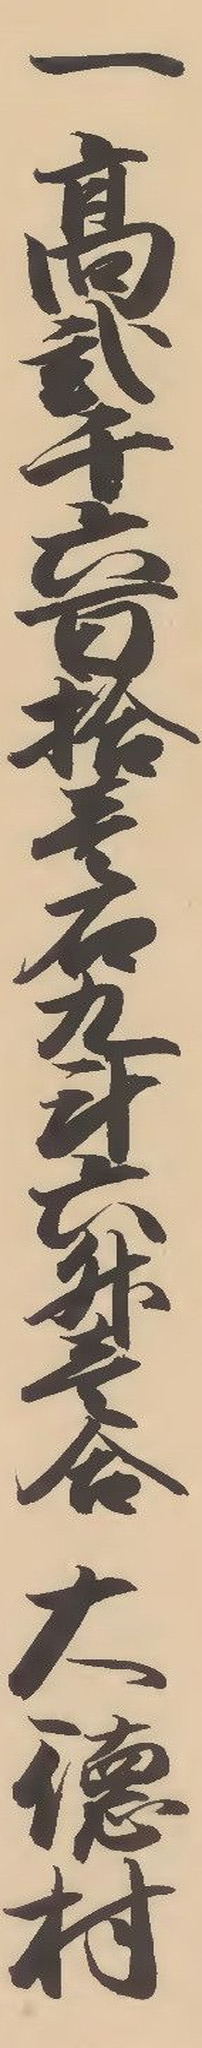一高弐千六百拾壱石九斗六升壱合大徳村
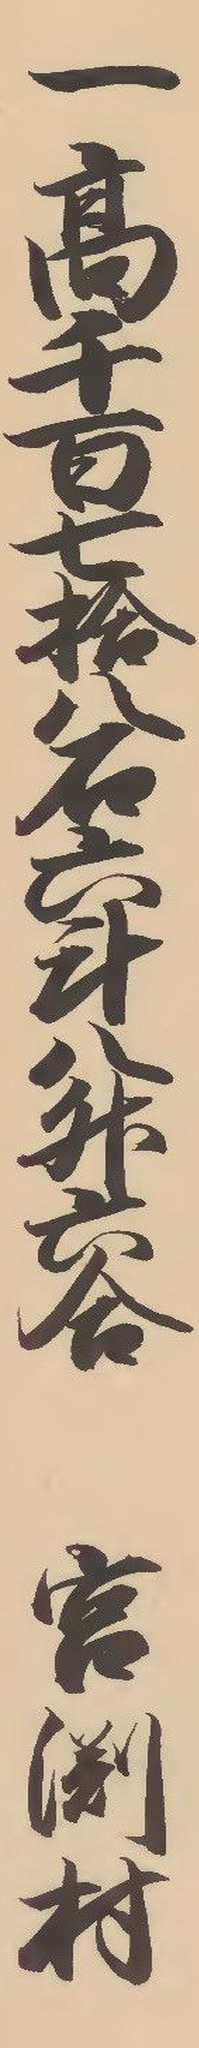一高千百七拾八石六斗八升六合宮淵村
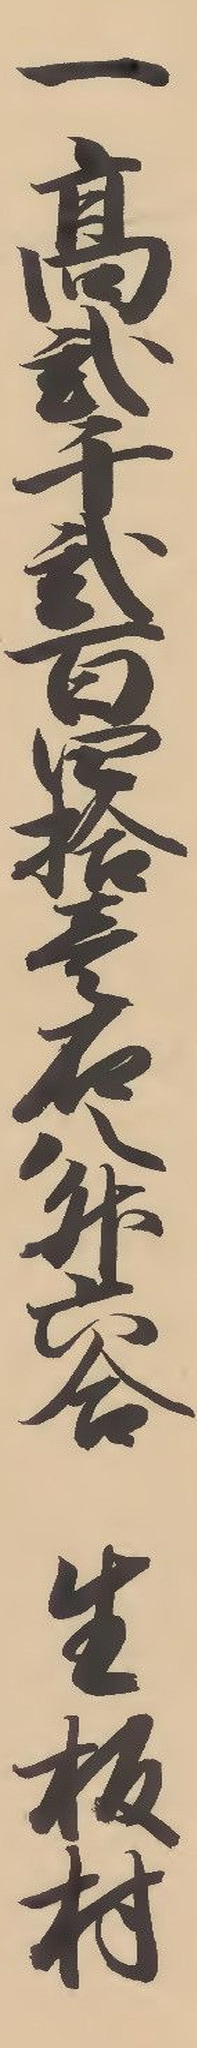一高弐千弐百四拾壱石八升六合生板村
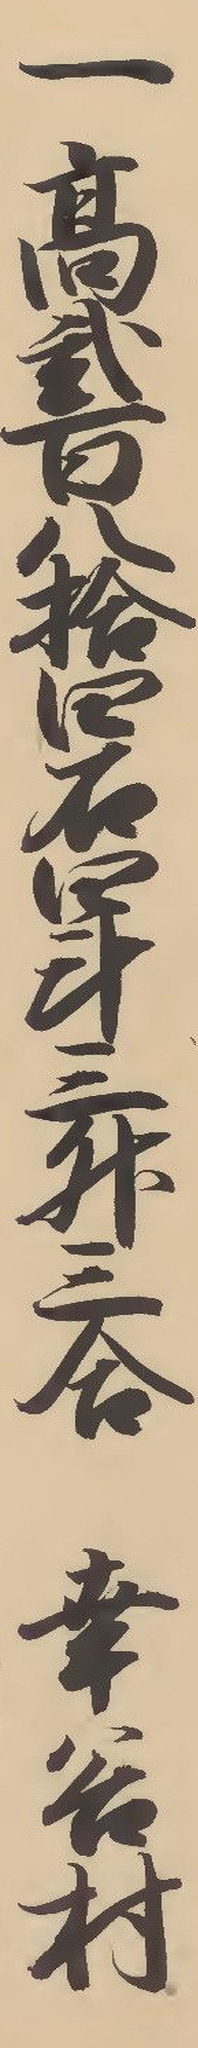一高弐百八拾四石四斗三升三合幸谷村
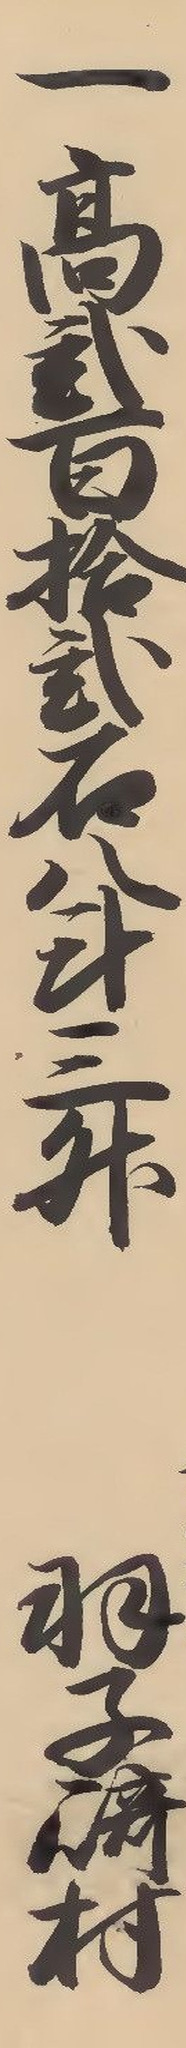一高弐百拾弐石八斗三升羽子崎村
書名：常陸国郷帳
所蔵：国立公文書館 National Archives of Japan
